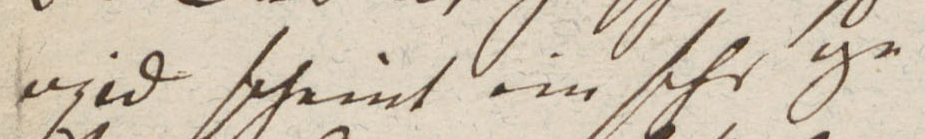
oxid scheint ein sehr ge-
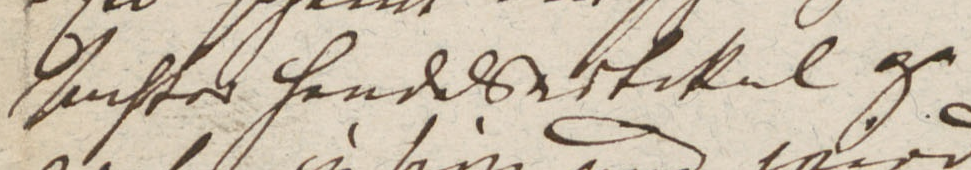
suchter Handelsartikel ge-
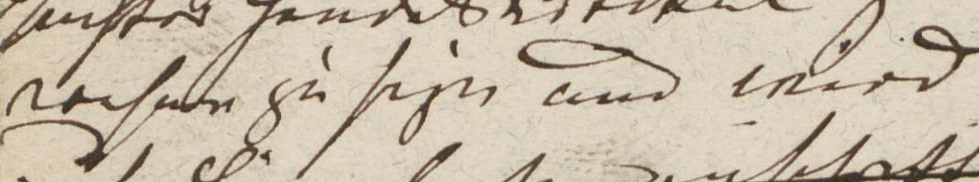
wesen zu seyn und wird
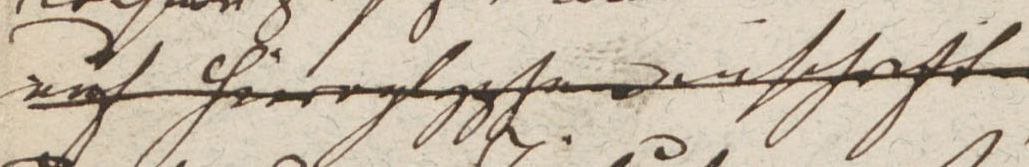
auf Hieroglypheninschriften
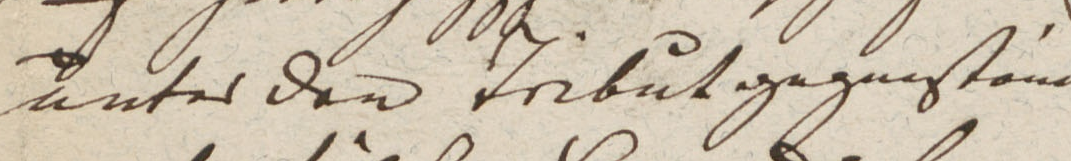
unter den Tributgegenständen
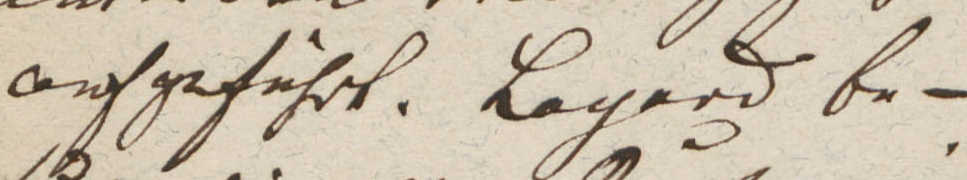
aufgeführt. Layard be-
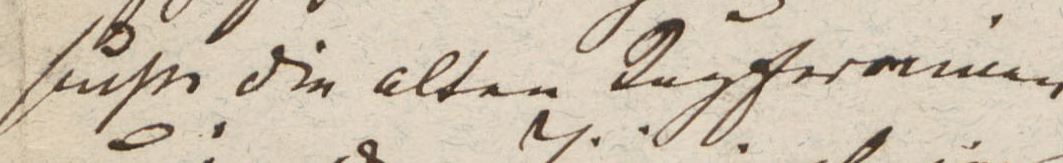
suchte die alten Kupferminen
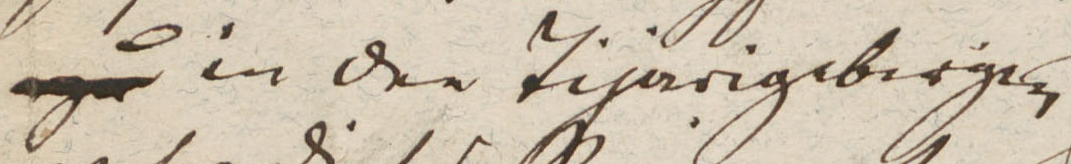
zu in den Tijarigebirgen
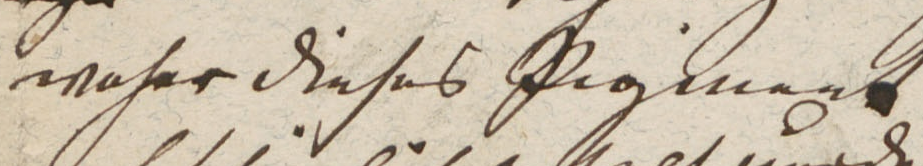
woher dieses Pigment
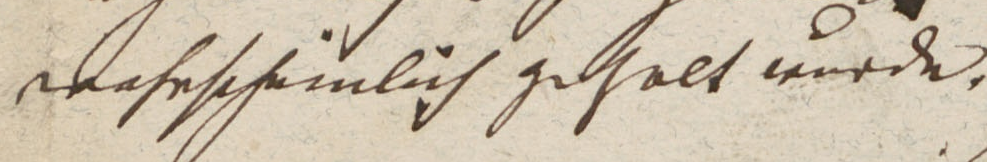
wahrscheinlich geholt wurde.
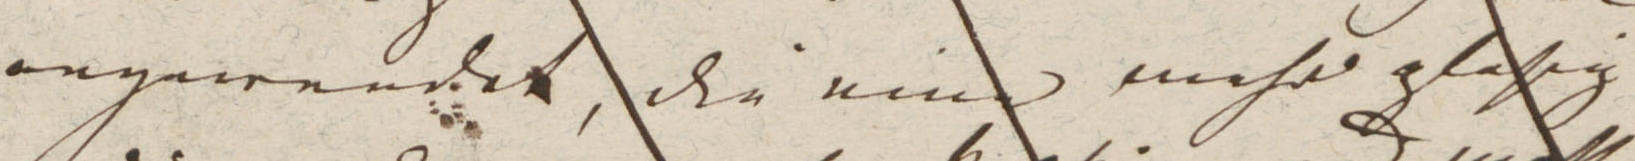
angewendet, die eine mehr glasig
